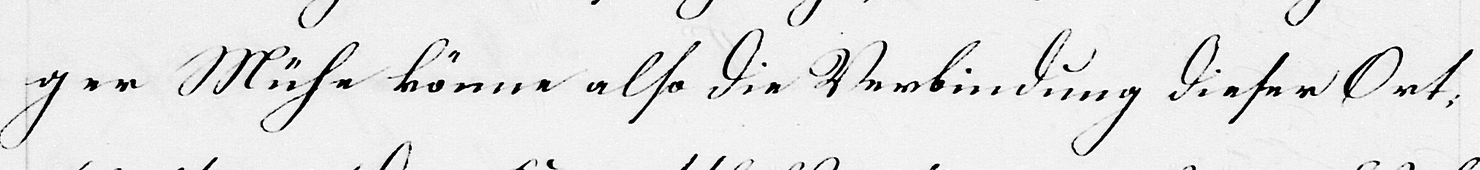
ger Mühe könne also die Verbindung dieser Ort¬
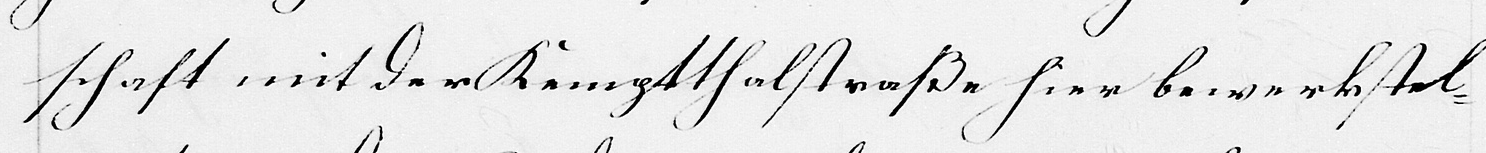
schaft mit der Kemptthalstraße hier bewerkstel¬
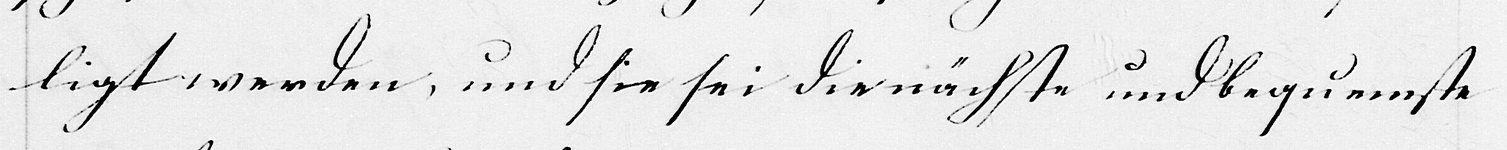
ligt werden, und sie sei die nächste und bequemste
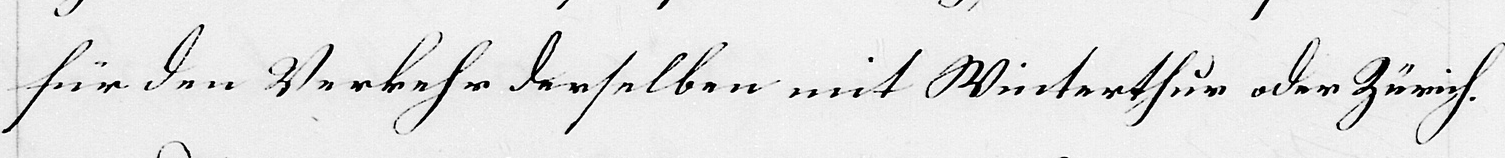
für den Verkehr derselben mit Winterthur oder Zürich.
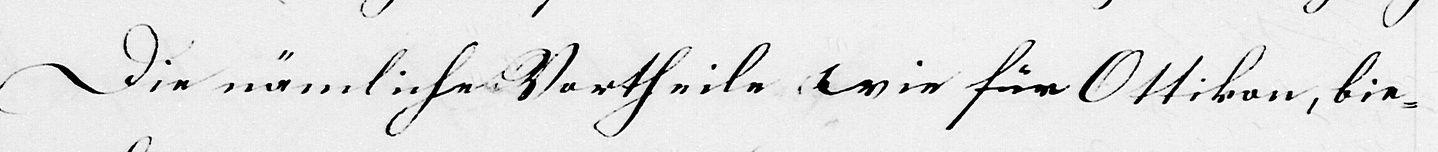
Die nämliche Vortheile wie für Ottikon, bie¬
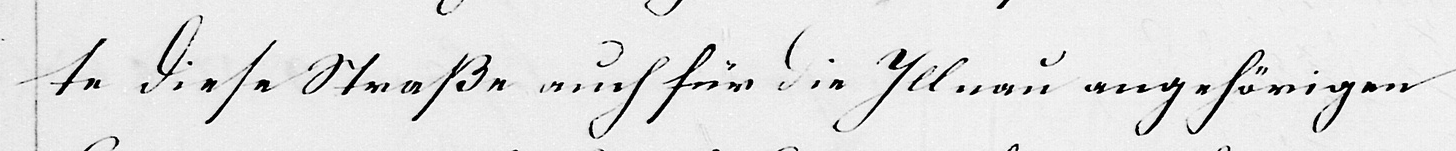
te diese Straße auch für die Illnau angehörigen
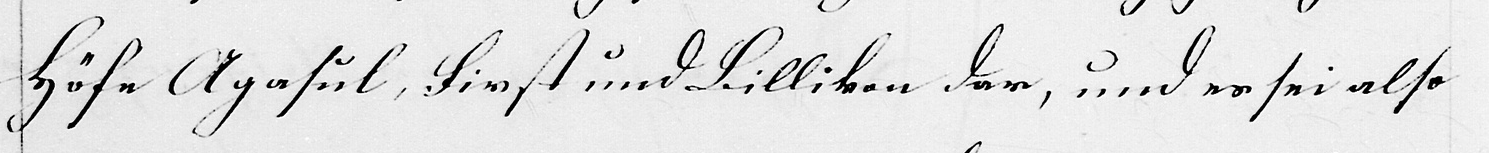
Höfe Agasul, First und Billikon dar, und es sei also
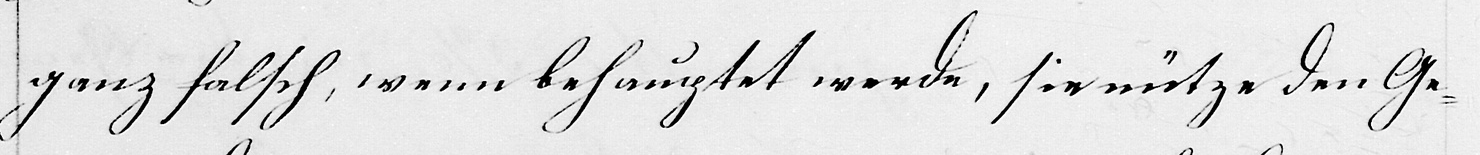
ganz falsch, wenn behauptet werde, sie nütze den Ge¬
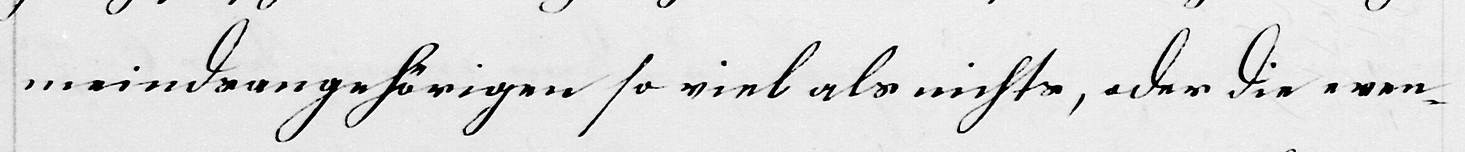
meindsangehörigen so viel als nichts, oder die even¬
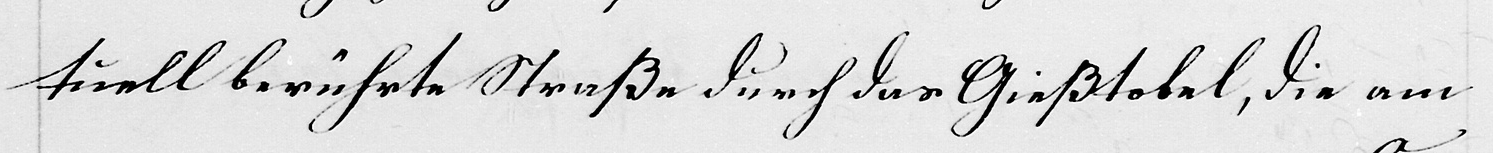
tuell berührte Straße durch das Gießtobel, die am
